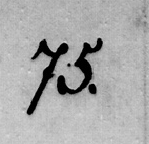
J.
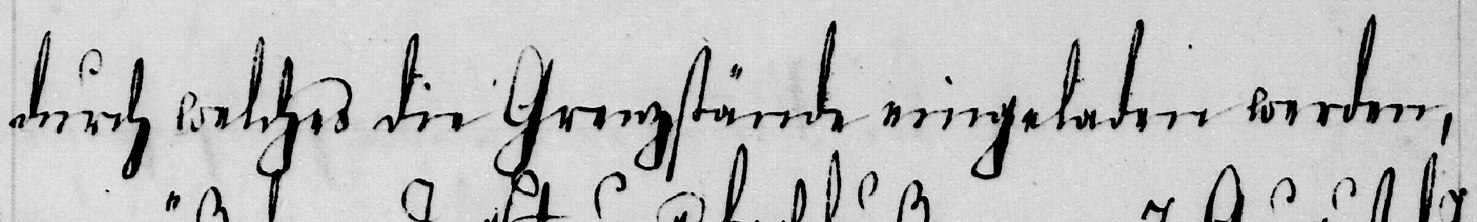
durch welches die Grenzstände eingeladen werden,
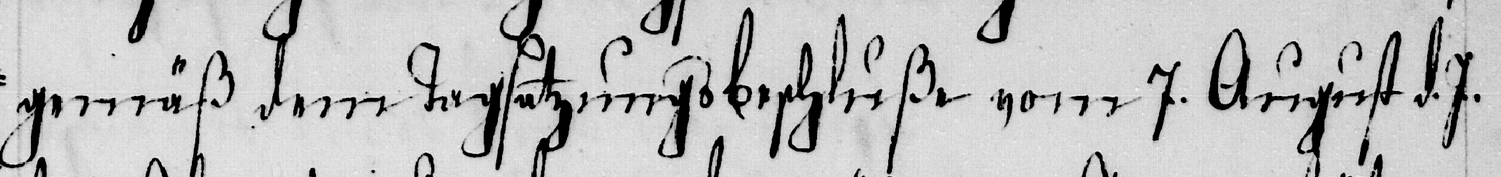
gemäß dem Tagsatzungsbeschluße vom 7. August d.
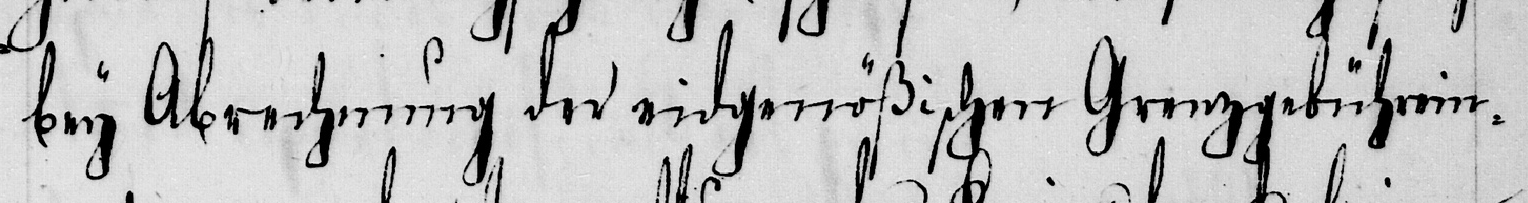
bey Abrechnung der eidgenößischen Grenzgebührein¬
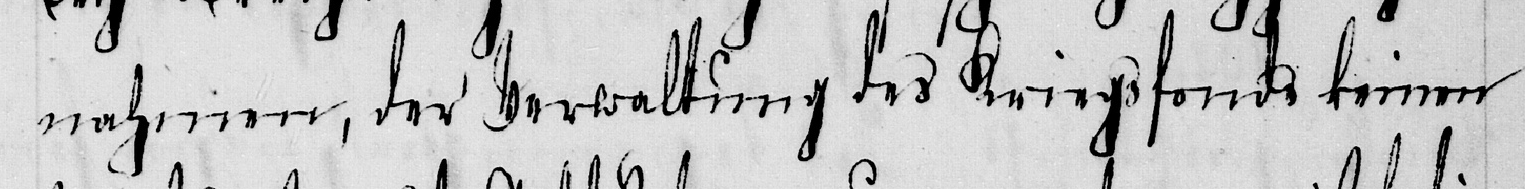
nahmen, der Verwaltung des Kriegsfonds keinen
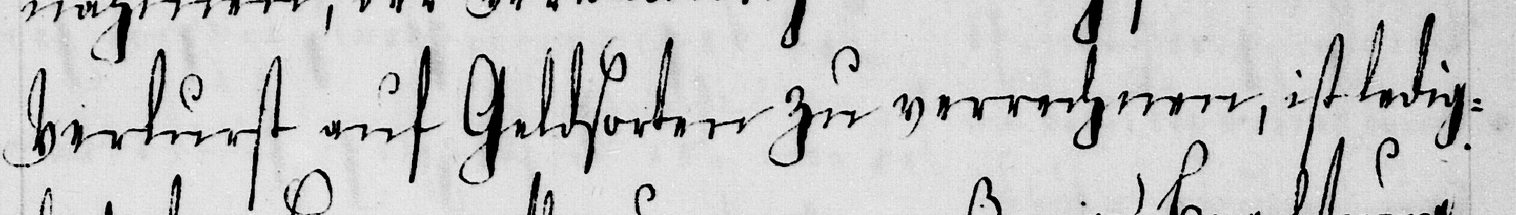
Verlust auf Geldsorten zu verrechnen, ist ledig¬
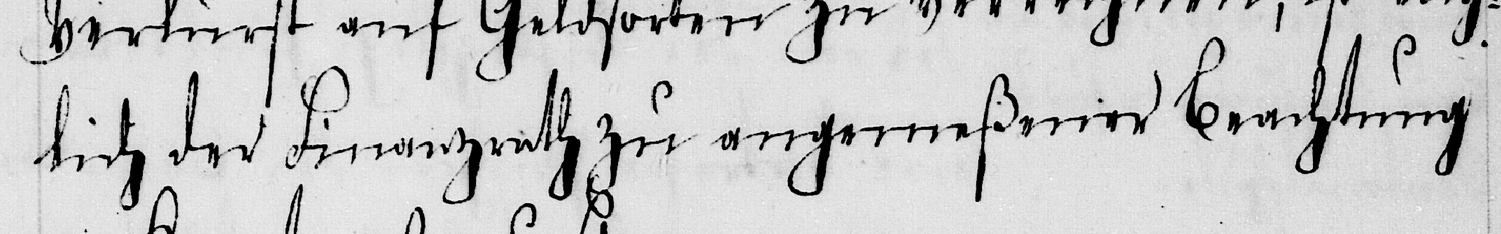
lich der Finanzrath zu angemeßener Beachtung
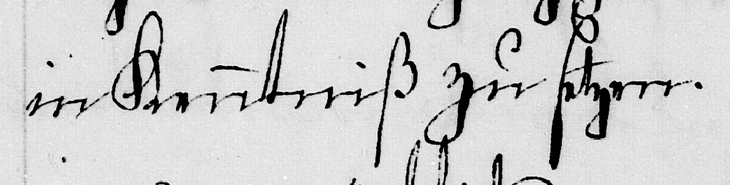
in Kenntniß zu setzen.
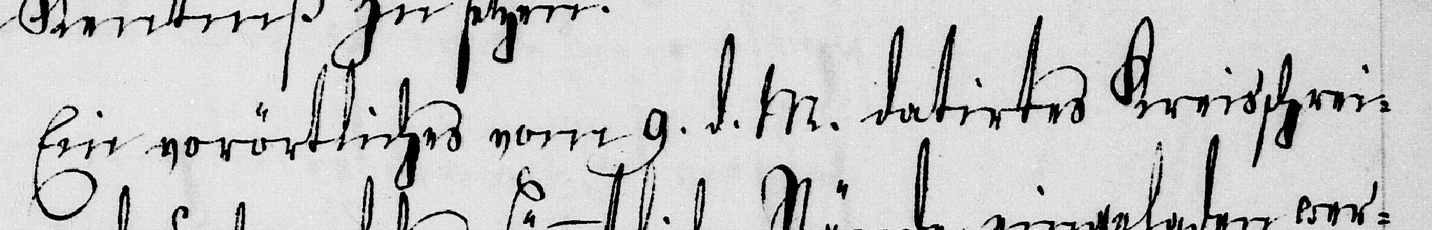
Ein vorörtliches vom 9. d. M. datirtes Kreisschrei¬
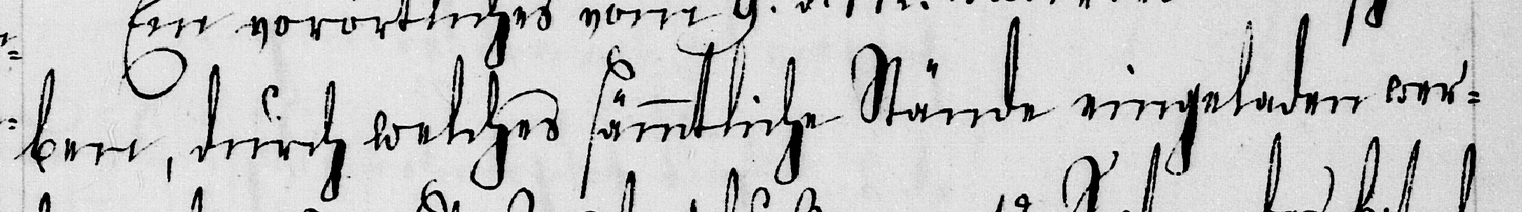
ben, durch welches sämmtliche Stände eingeladen wer¬
